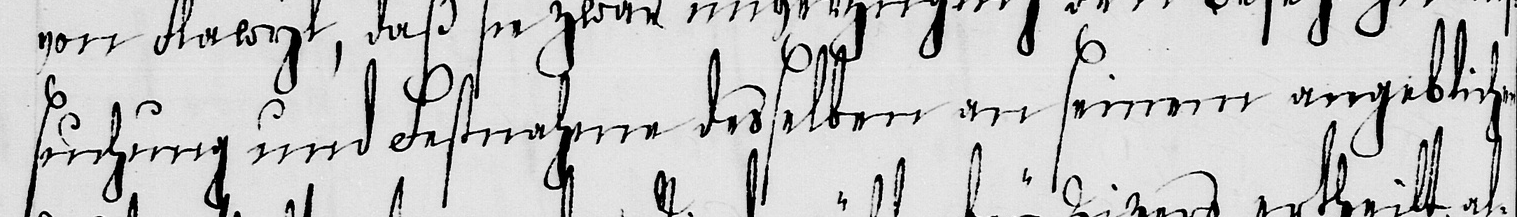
suchung und Festnahme desselben an seinem angeblic¬
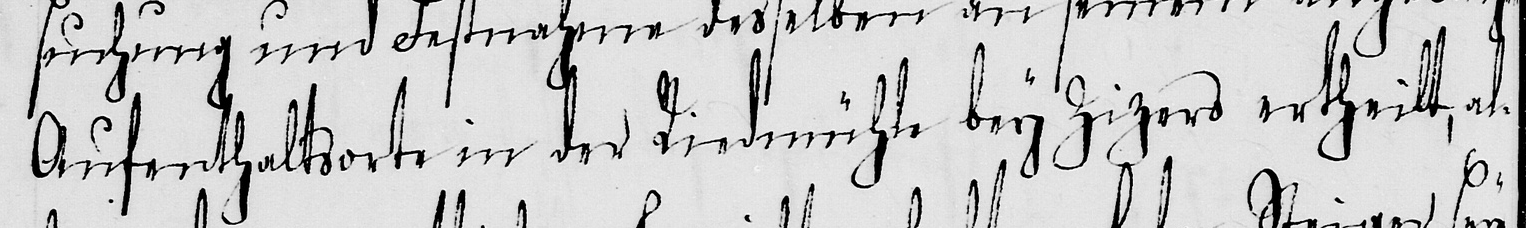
Aufenthaltsorte in der Riedmühle bey Zizers ertheilt,
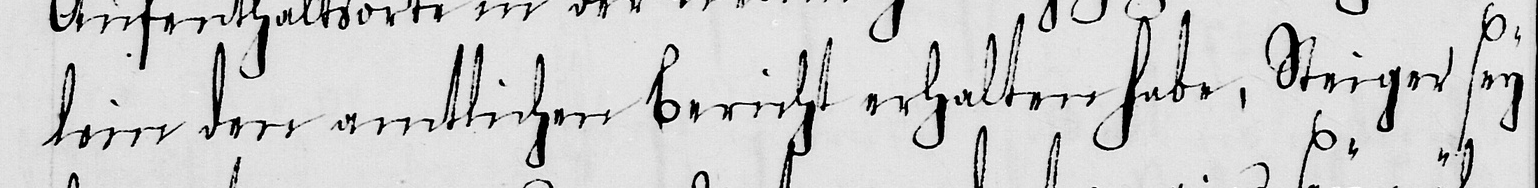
lein den amtlichen Bericht erhalten habe, Steiger sey
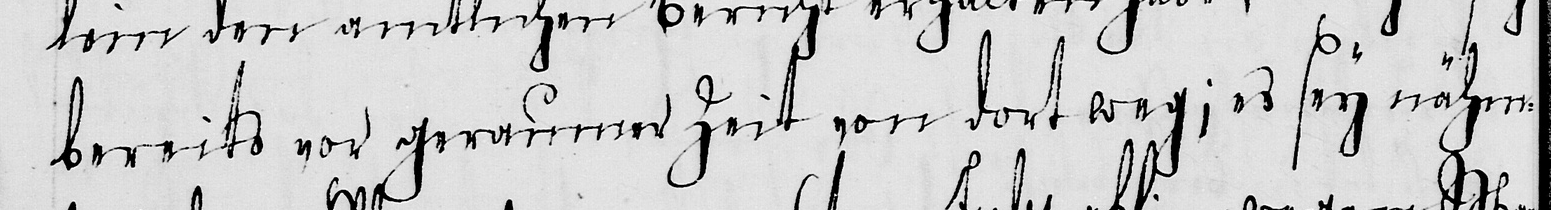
bereits vor geraumer Zeit von dort weg; es sey nähm¬
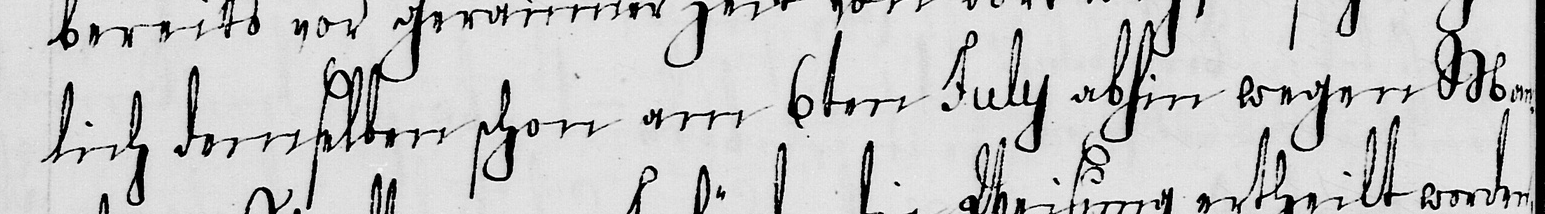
lich demselben schon am 6ten July abhin wegen Man¬
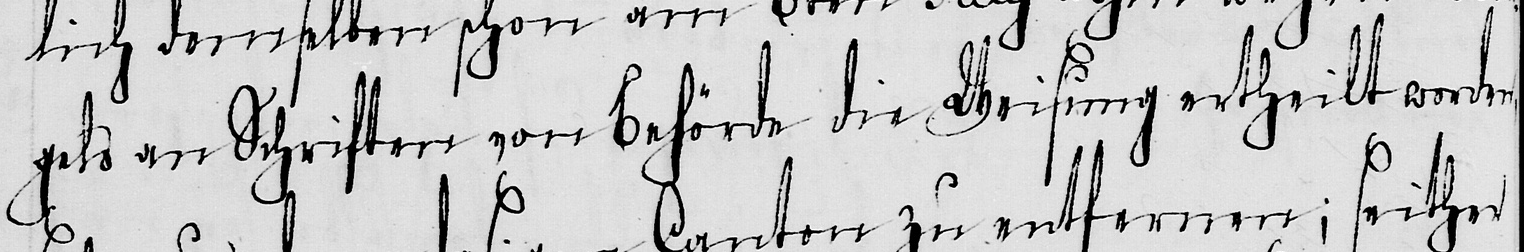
gels an Schriften von Behörde die Weisung ertheilt word¬
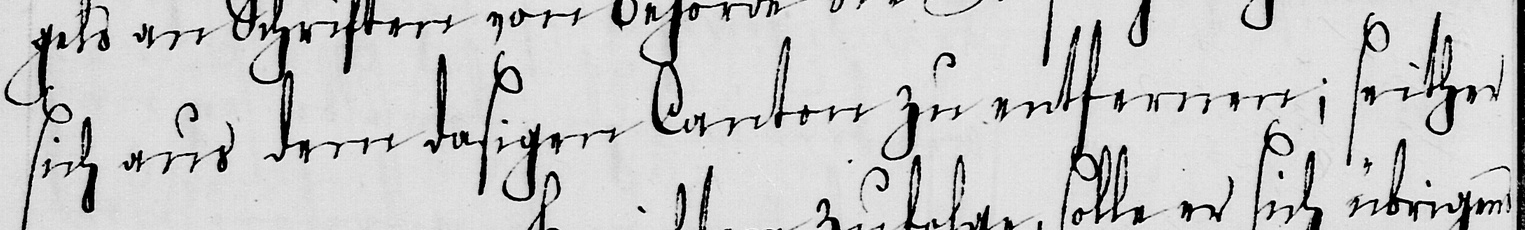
sich aus dem dasigen Canton zu entfernen; seither
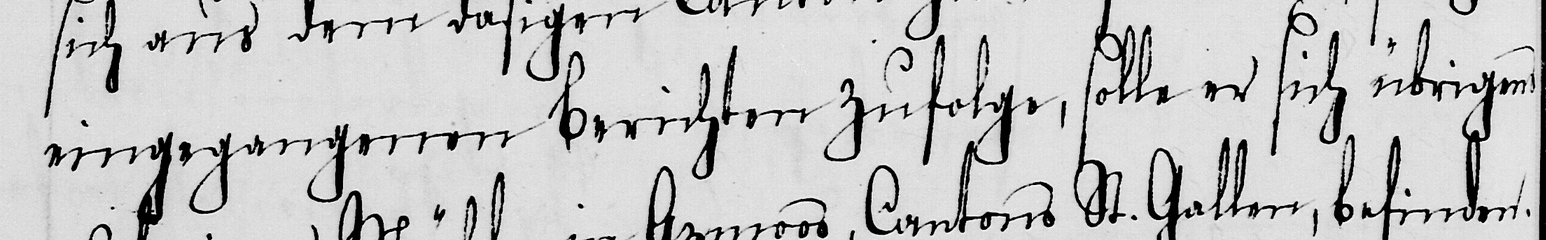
eingegangenen Berichten zufolge, solle er sich übrigens
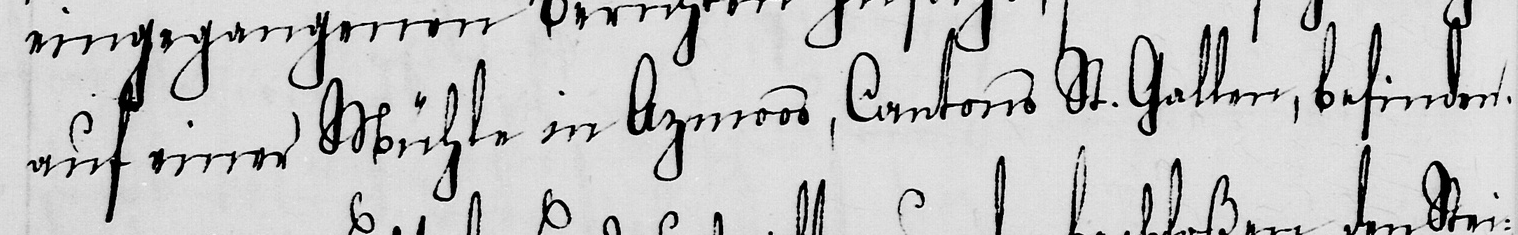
auf einer Mühle in Azmoos, Cantons St. Gallen, befinden.
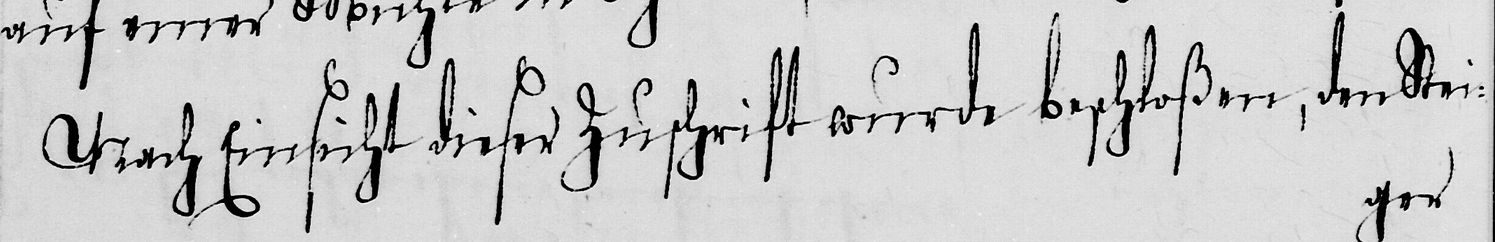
Nach Einsicht dieser Zuschrift wurde beschloßen, den St¬
